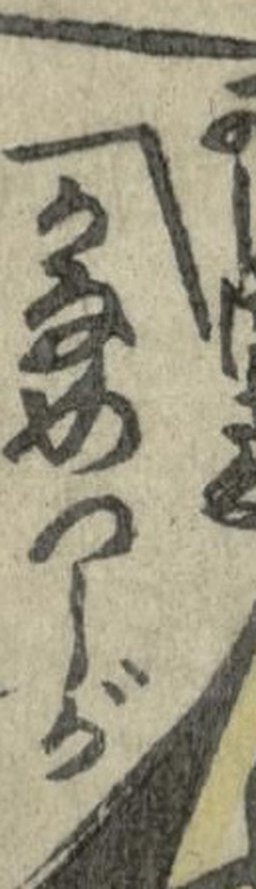〽かなめいしが
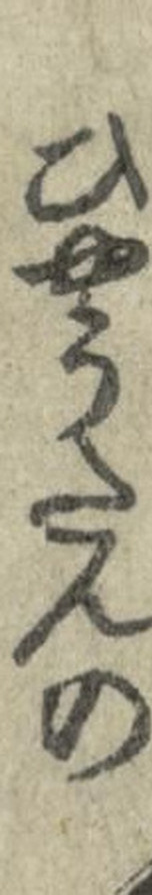ひやうたんの
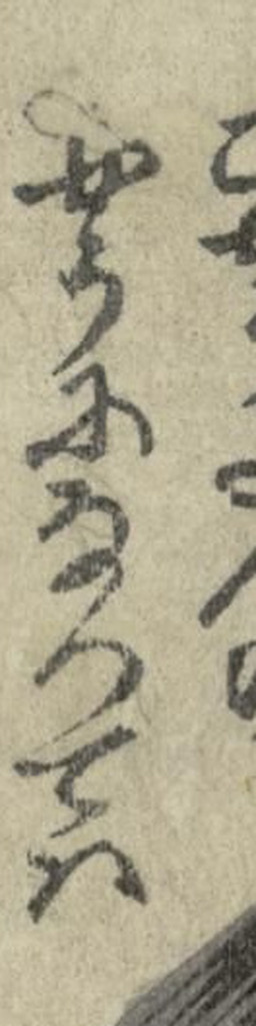やうになつては
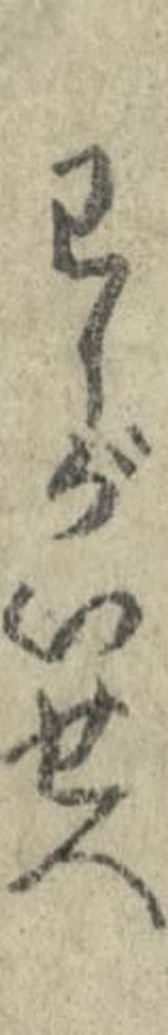わしがいせへ
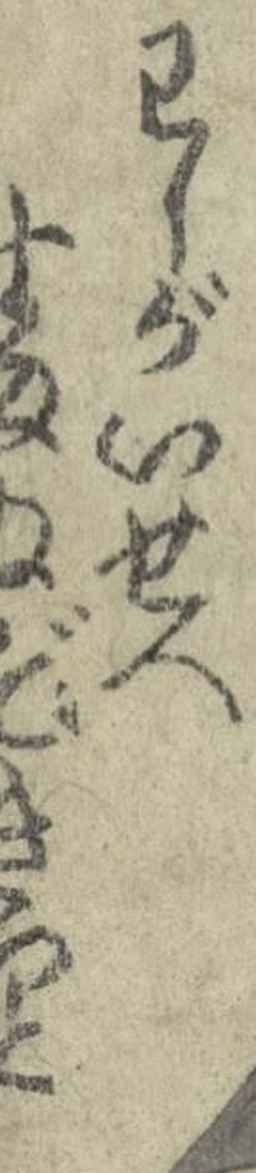すまぬぞきつと
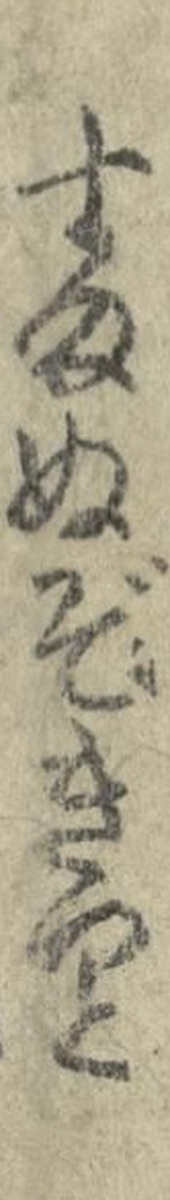すまぬぞきつと
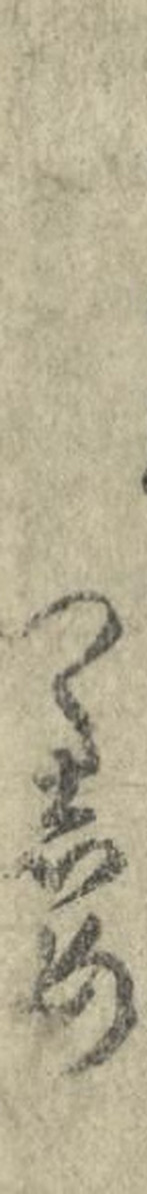つゝしめ
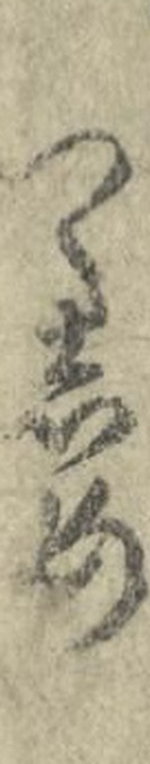つゝしめ
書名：差出し申御詫一札之事
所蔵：東京大学地震研究所図書室 Earthquake Research Institute Library, The University of Tokyo, JAPAN
